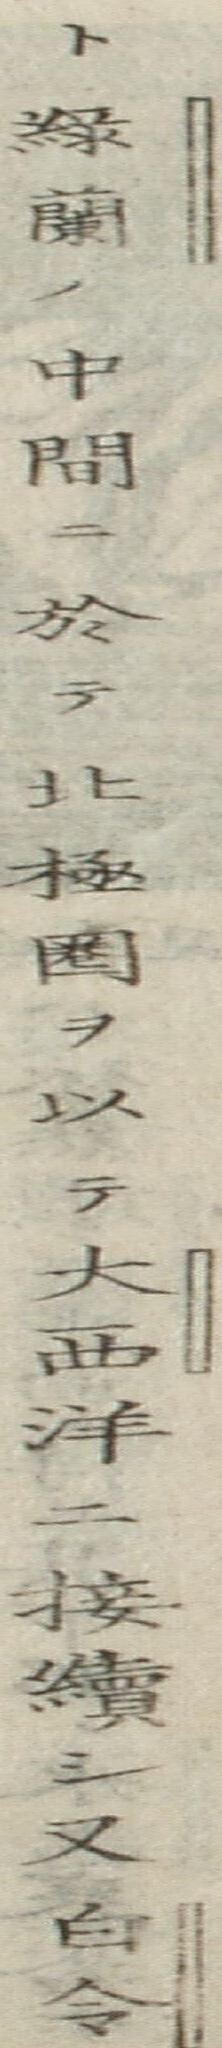ト緑蘭ノ中間ニ於テ北極圏ヲ以テ大西洋ニ接続シ又白令
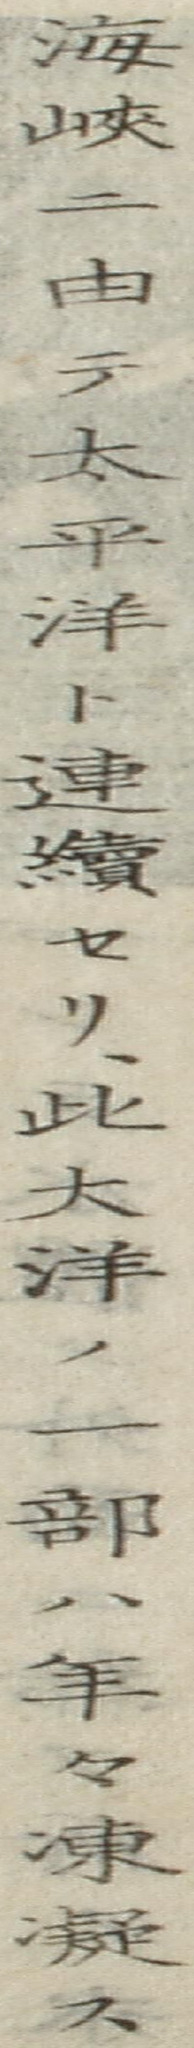海峡ニ由テ太平洋ト連続セリ、此大洋ノ一部ハ年々凍凝ス
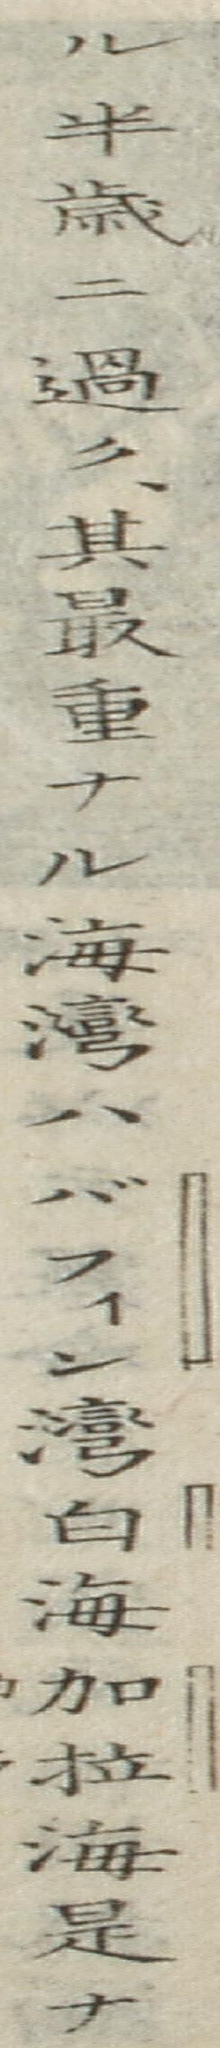ル半歳ニ過ク、其最重ナル海湾ハバフィン湾白海加拉海是ナ
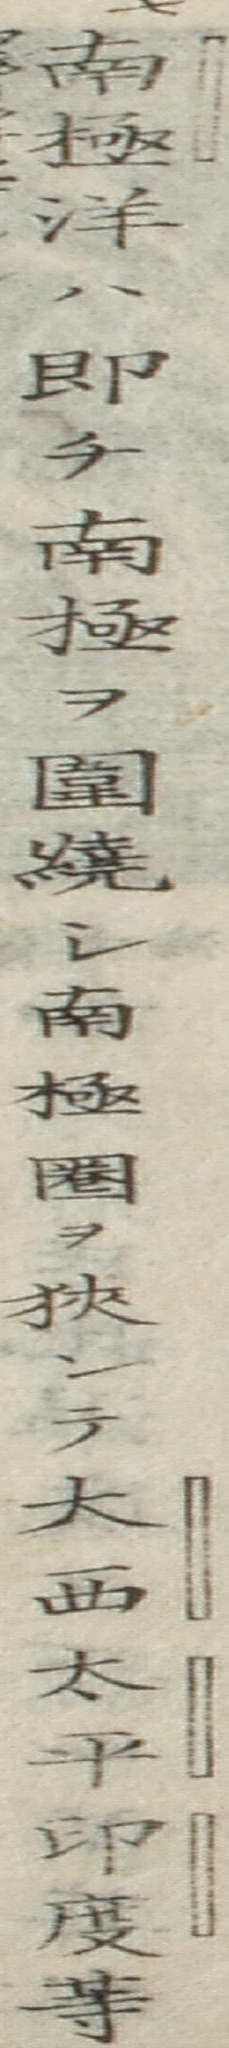七南極洋ハ即チ南極ヲ囲繞シ南極圏ヲ挟ンテ大西太平印度等
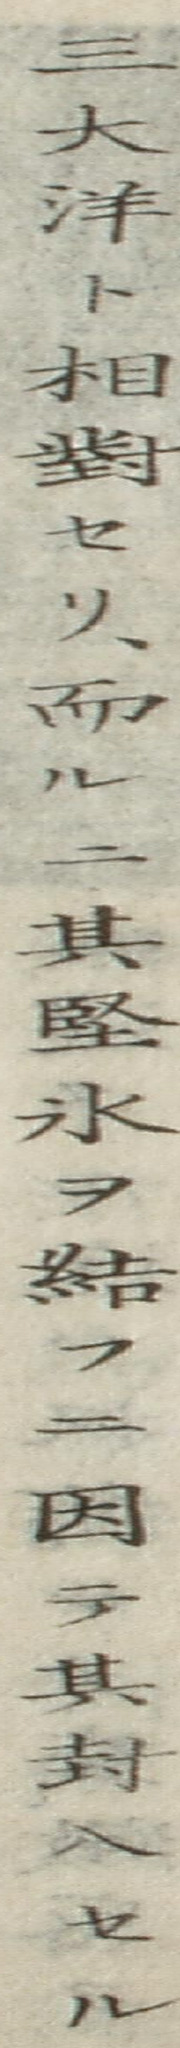三大洋ト相対セリ、而ルニ其堅氷ヲ結フニ因テ其封入セル
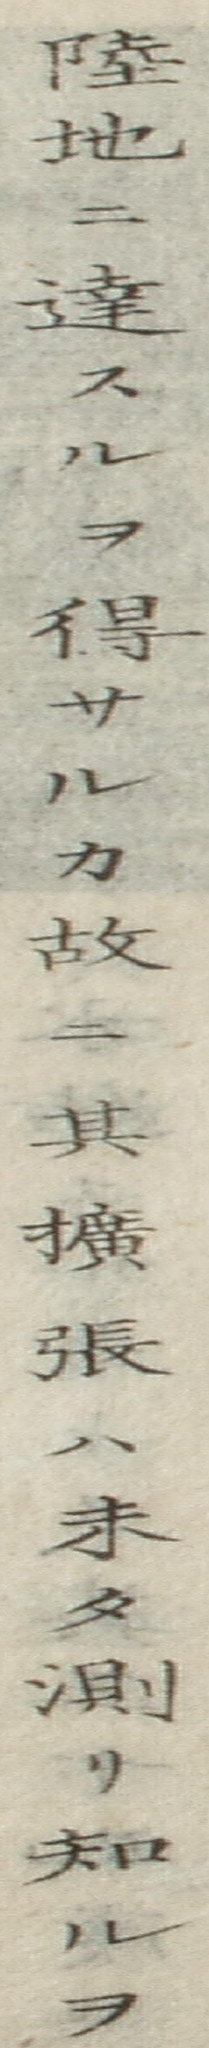陸地ニ達スルヲ得サルカ故ニ其拡張ハ未タ測リ知ルヲ
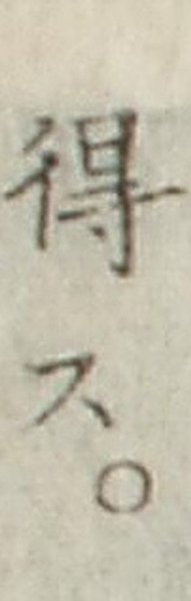得ス。
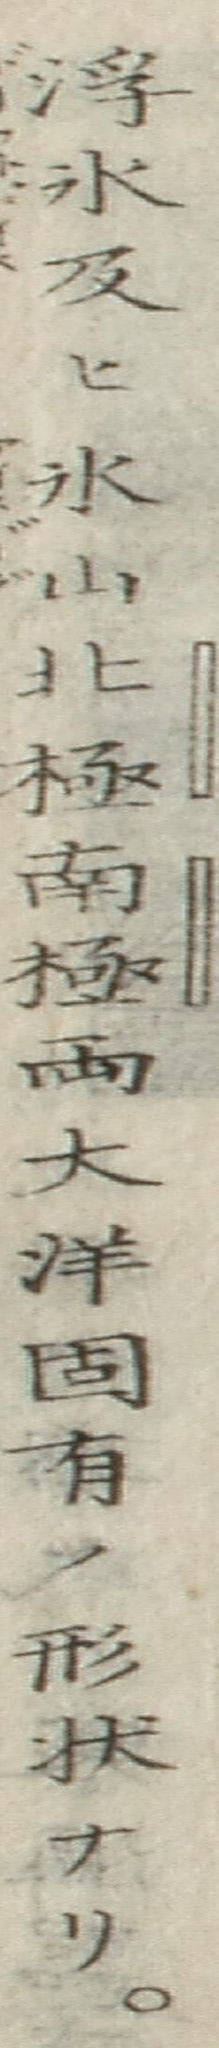浮氷及ヒ氷山北極南極両大洋固有ノ形状ナリ。

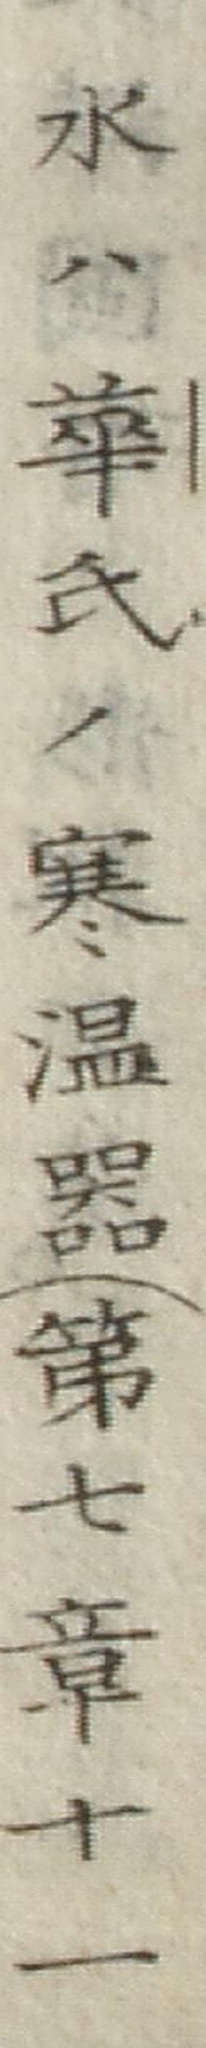水ハ華氏ノ寒温器（第七章十一
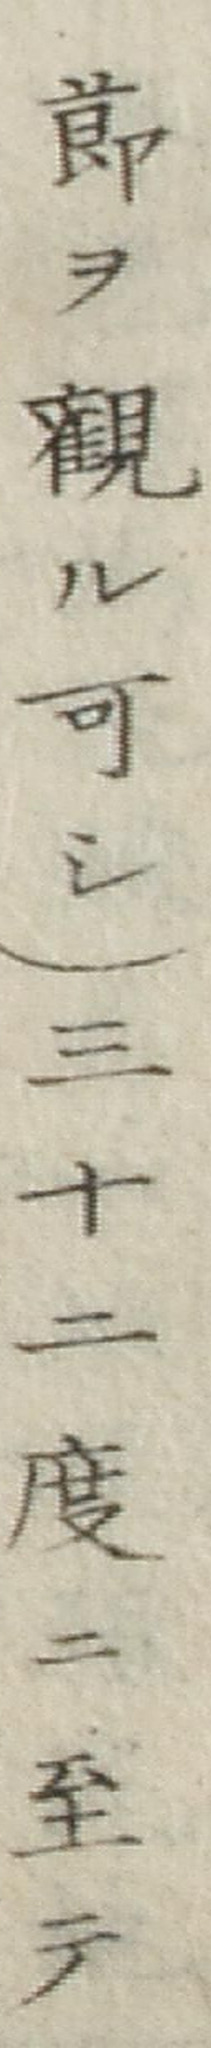節ヲ観ル可シ）三十二度ニ至テ
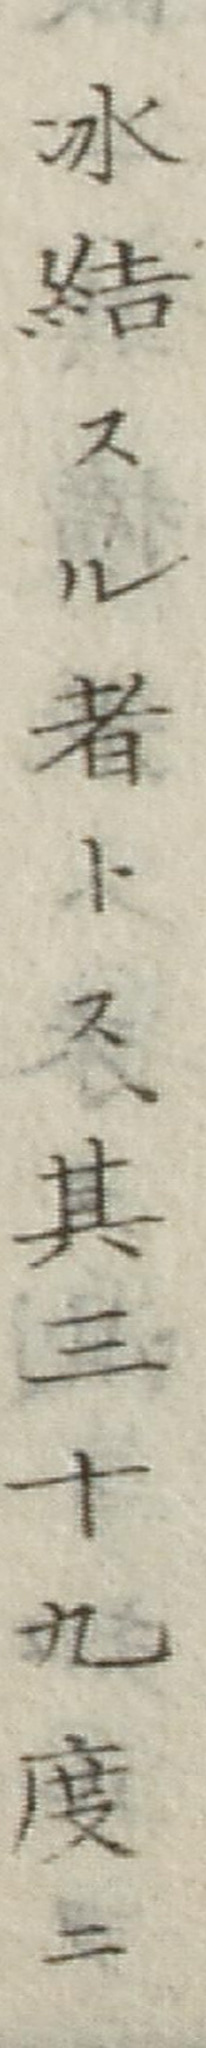氷結スル者トス、其三十九度ニ
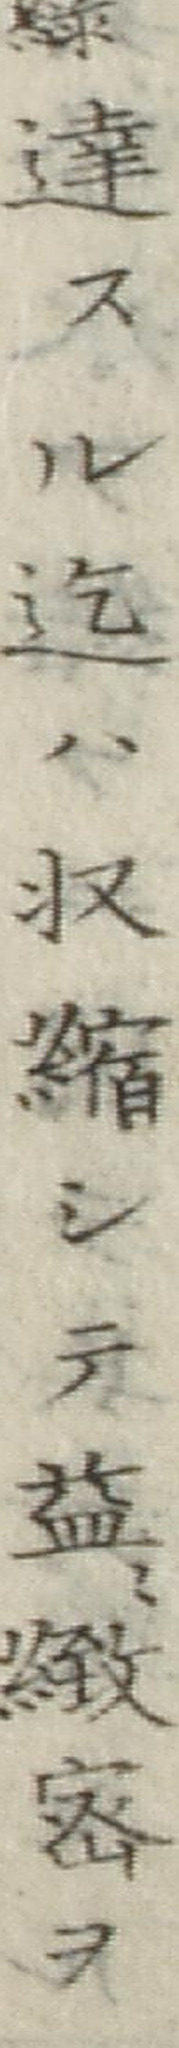達スル迄ハ収縮シテ益ゝ緻密ヲ
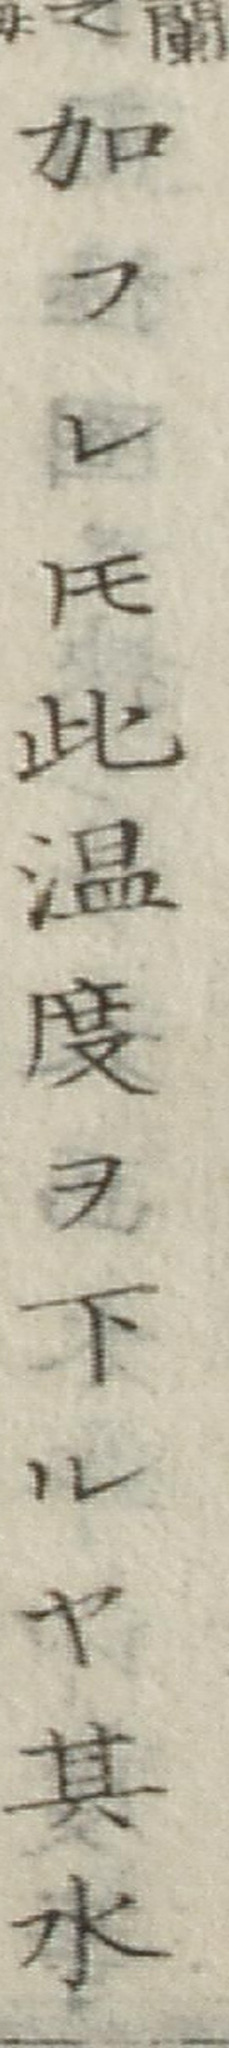加フレトモ此温度ヲ下ルヤ其水
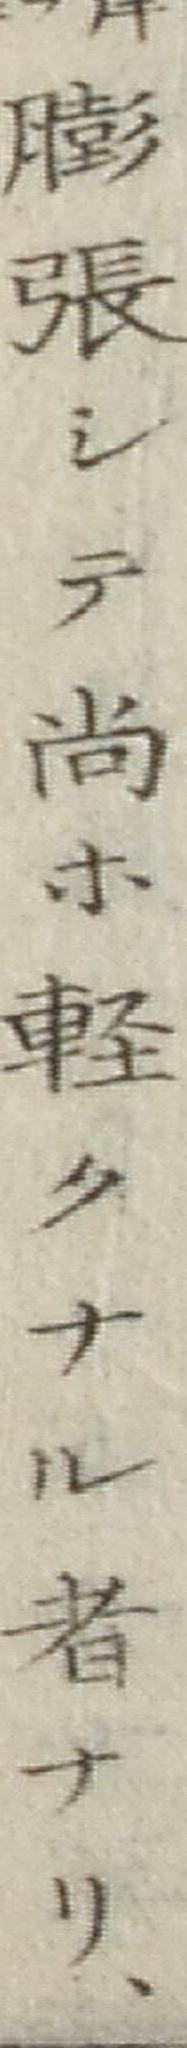膨張シテ尚ホ軽クナル者ナリ、
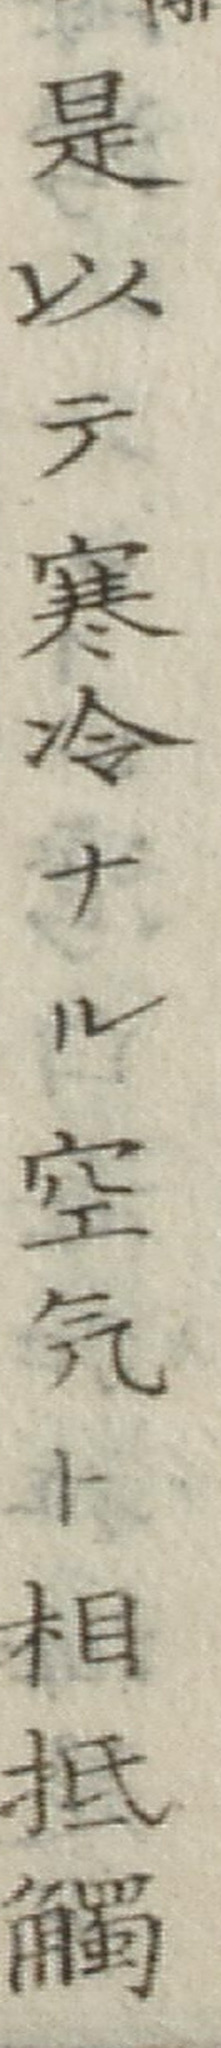是以テ寒冷ナル空気ト相抵触
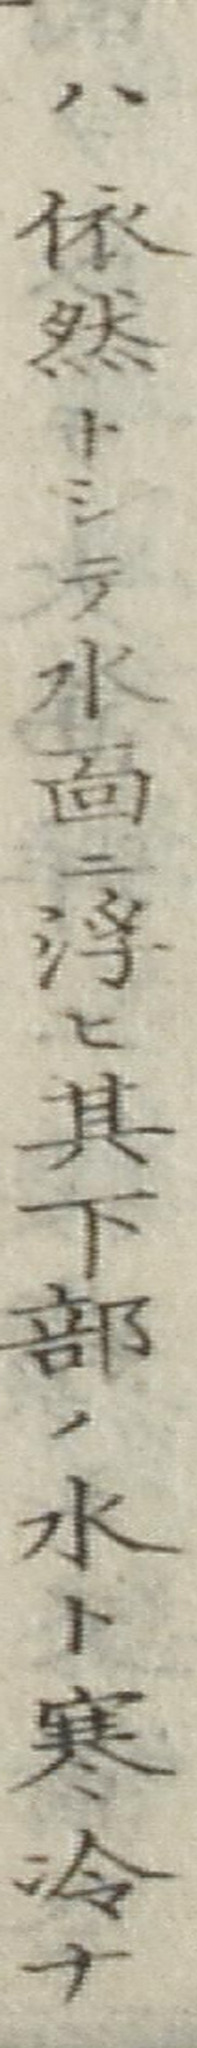ハ依然トシテ水面ニ浮ヒ其下部ノ水ト寒冷ナ
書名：地形論　巻二
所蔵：東京大学地震研究所図書室 Earthquake Research Institute Library, The University of Tokyo, JAPAN
